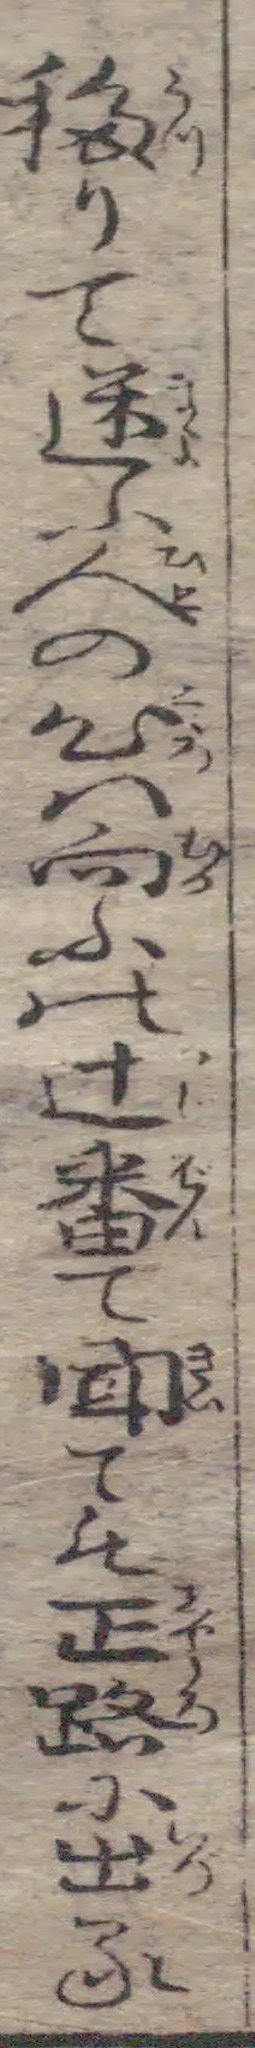移りて迷ふ人の心は向ふの辻番て聞ても正路に出る
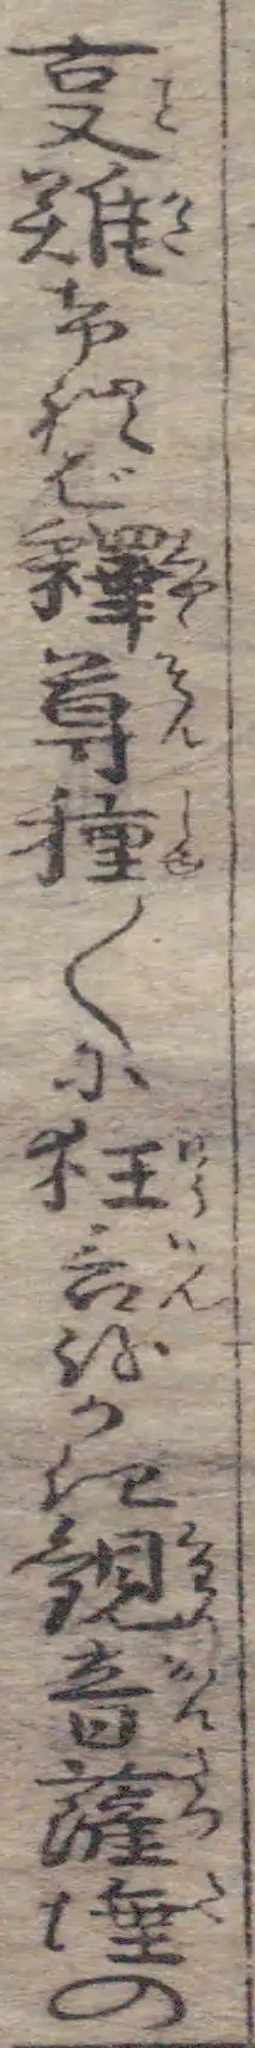事難ければ釈尊種〳〵に狂言をかき観音薩埵の
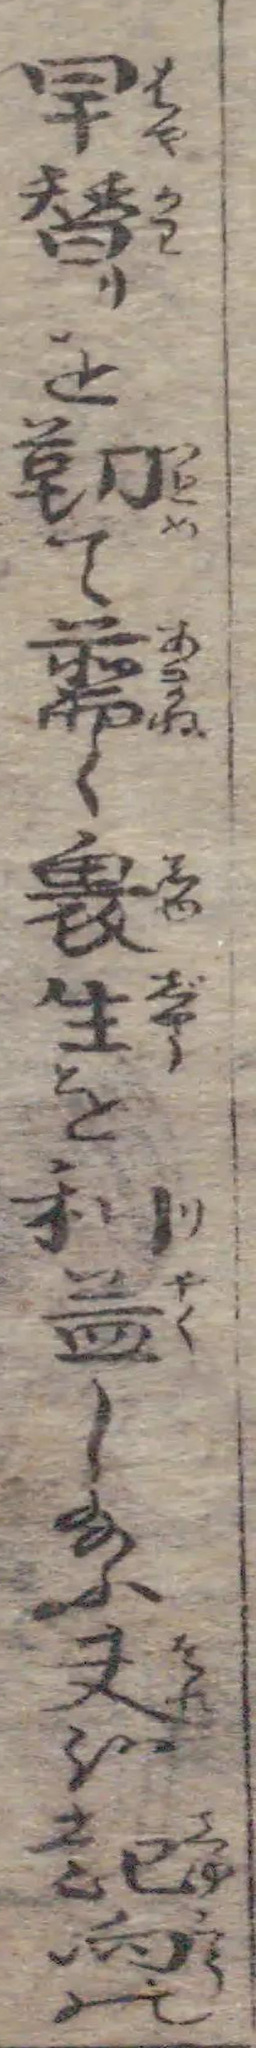早替りを勤てく衆生を利益し給ふ夫起向の
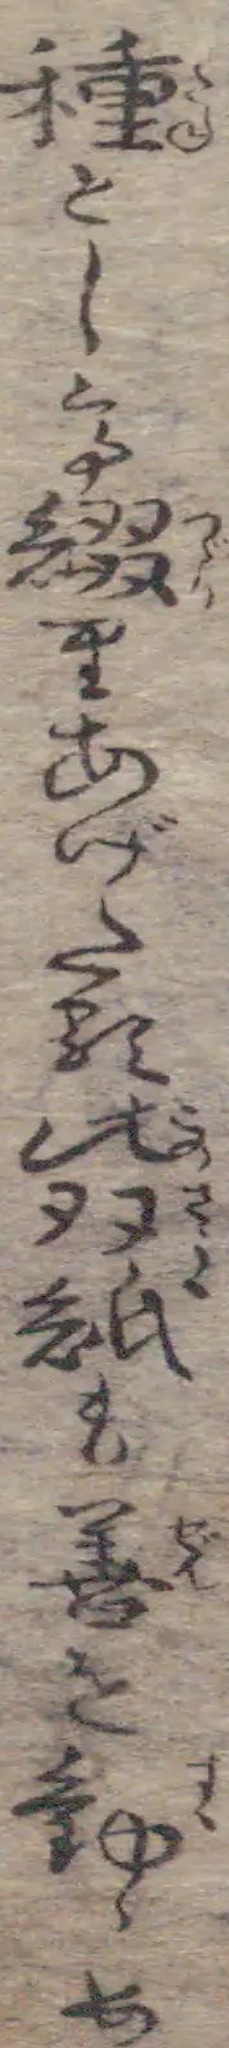種として綴りあげたる此双紙も善を勧め
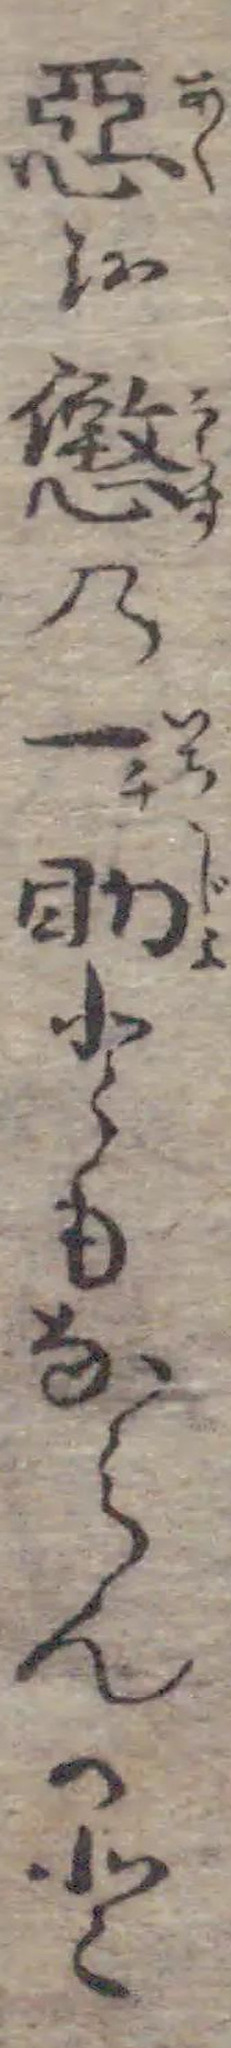悪を懲の一助ともならんのと
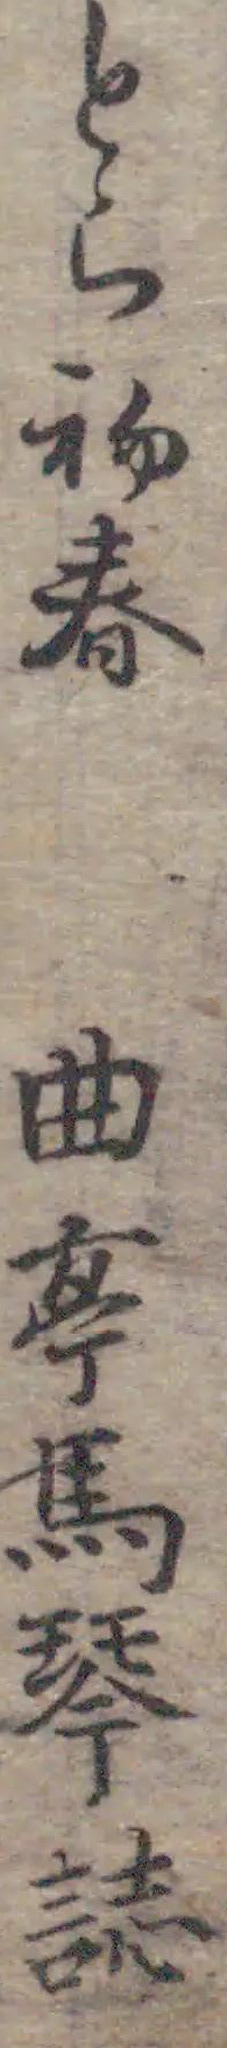とら初春曲亭焉琴誌

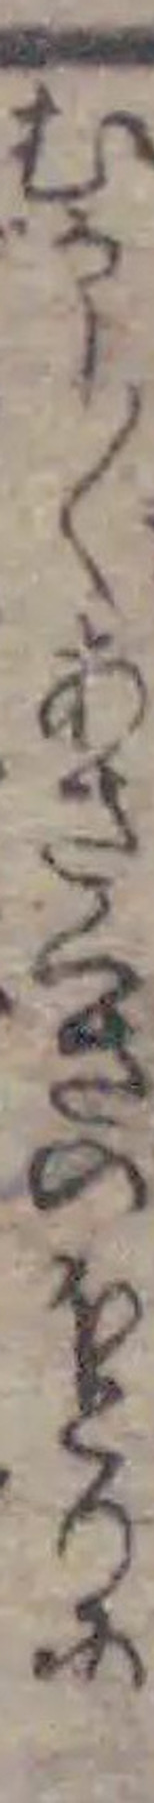むかし〳〵〔あさくさ〕のほとりに
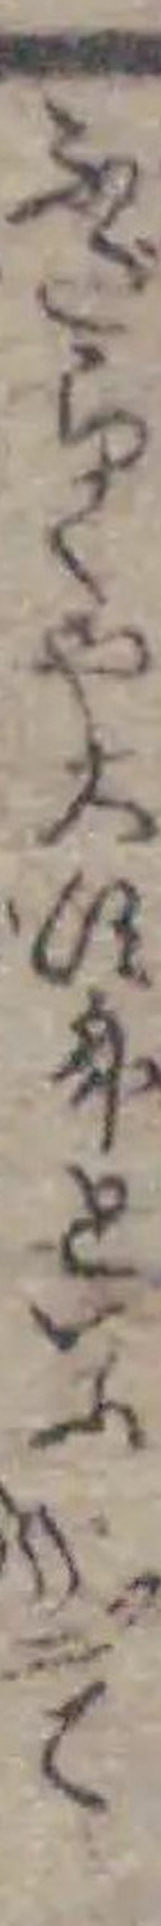ふだらくや大次郎といふ
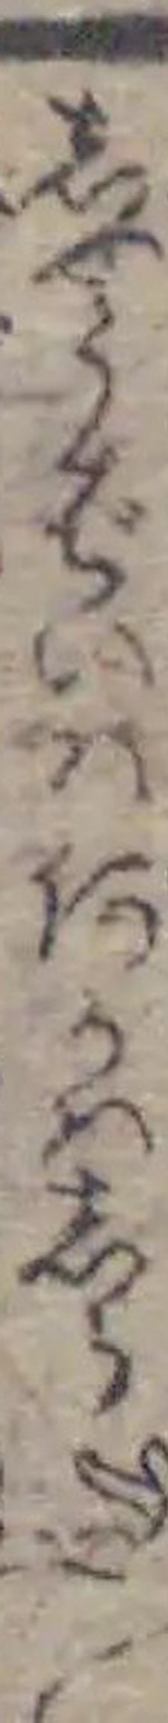しやうばいは何かはしら
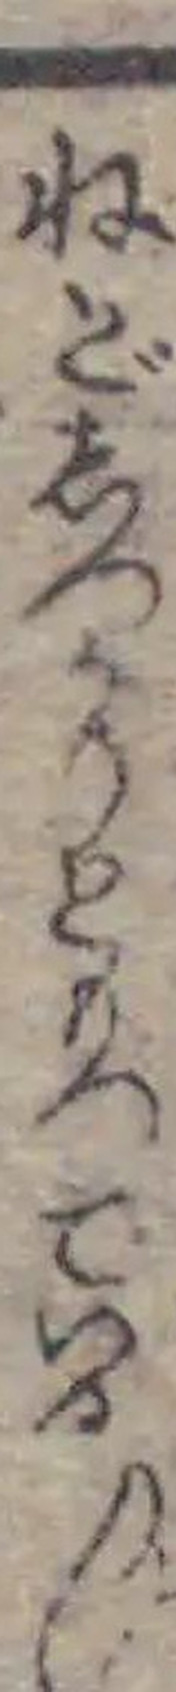ねどしつかりともつている
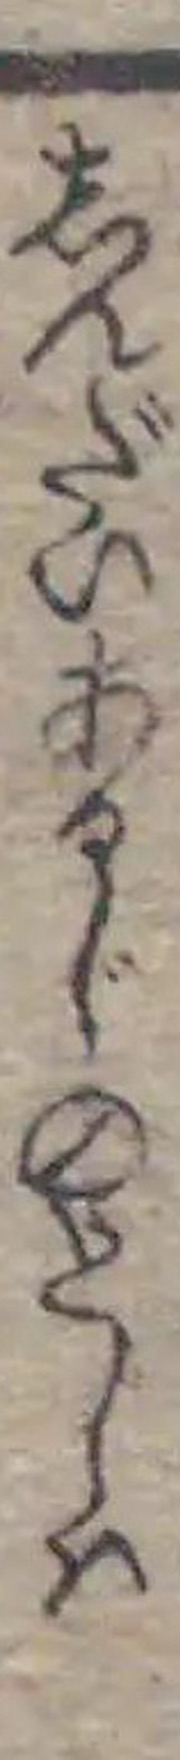しんだいあるじのとしは
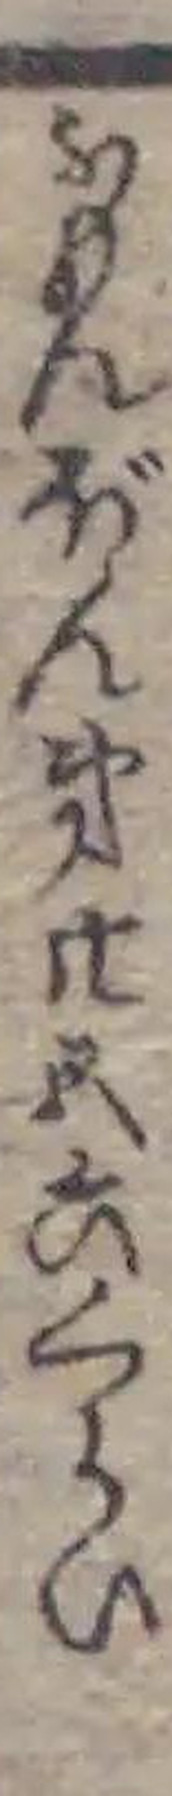ふもんぼん第廿五六くらい
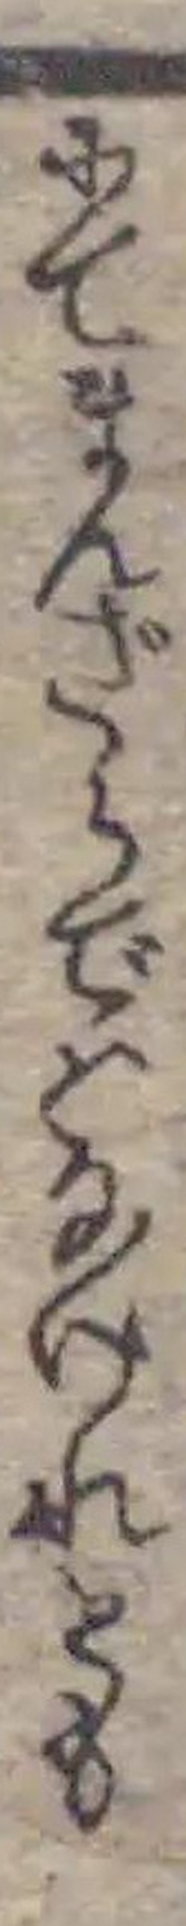にてまんざらではなけれとも
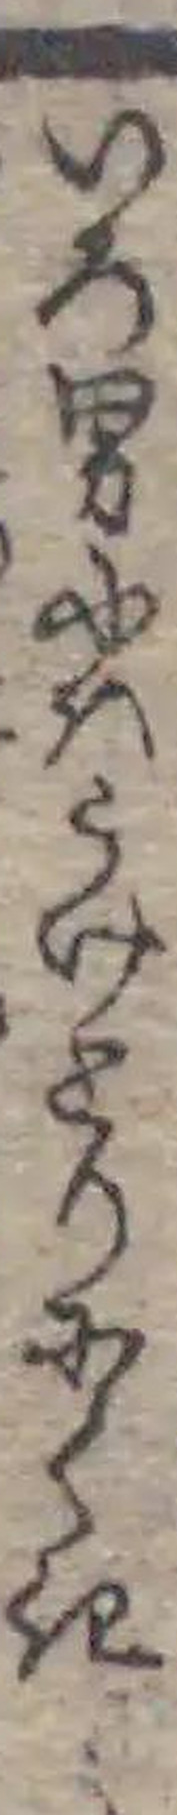いろ男にはうけとりにくき
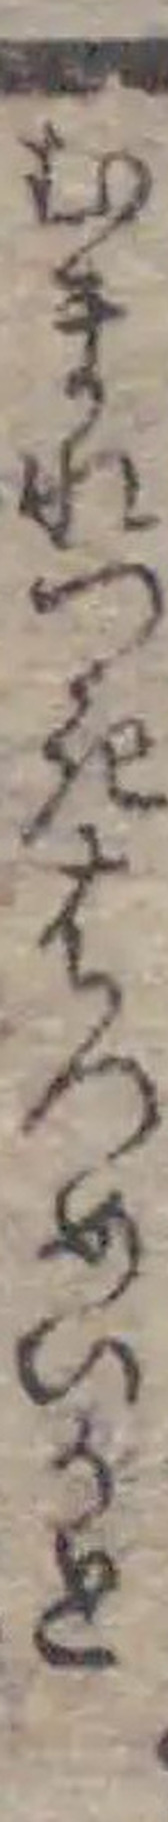むまれつきはつめいかと
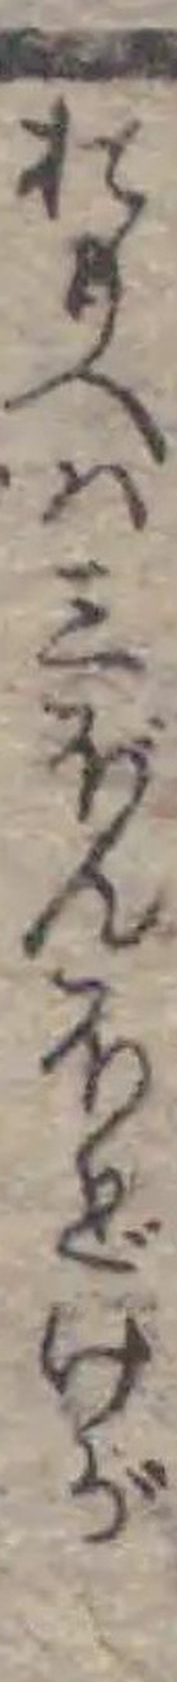おもへは三ぼんほどけが
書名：福壽海旡量品玉 3巻
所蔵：国立国会図書館 National Diet Library, JAPAN
